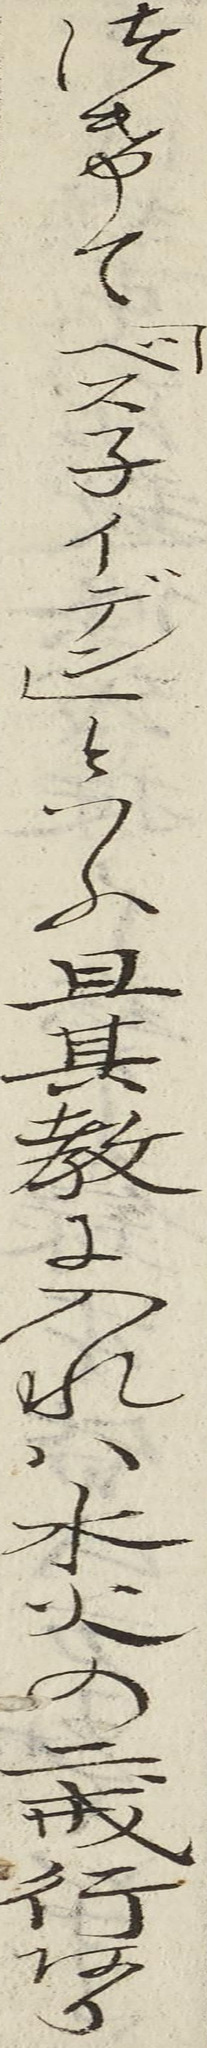つけて「ベス子イデン」といふ且其教に入れハ水火の二戒行なり
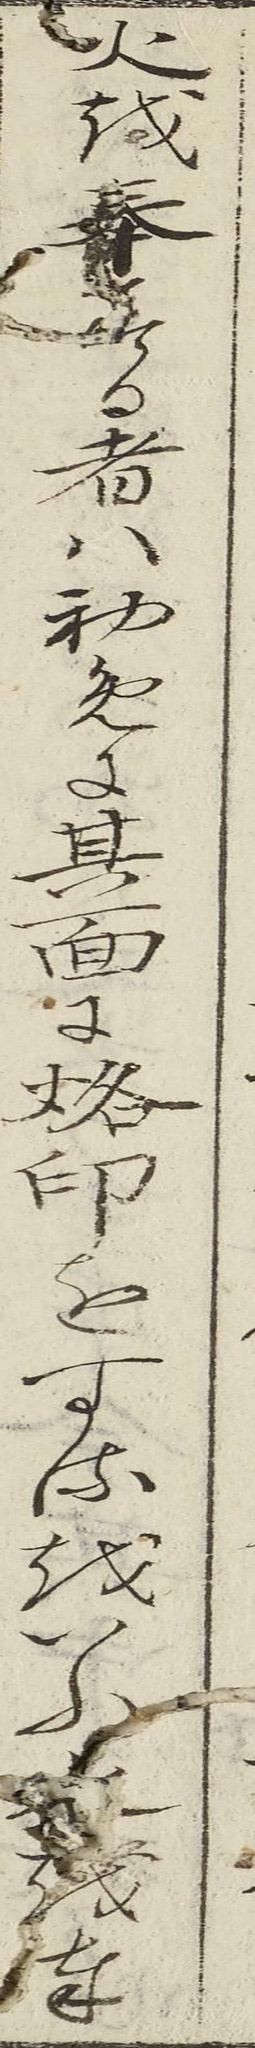火を奉する者ハ初めに其面に烙印をするをいふ水を奉
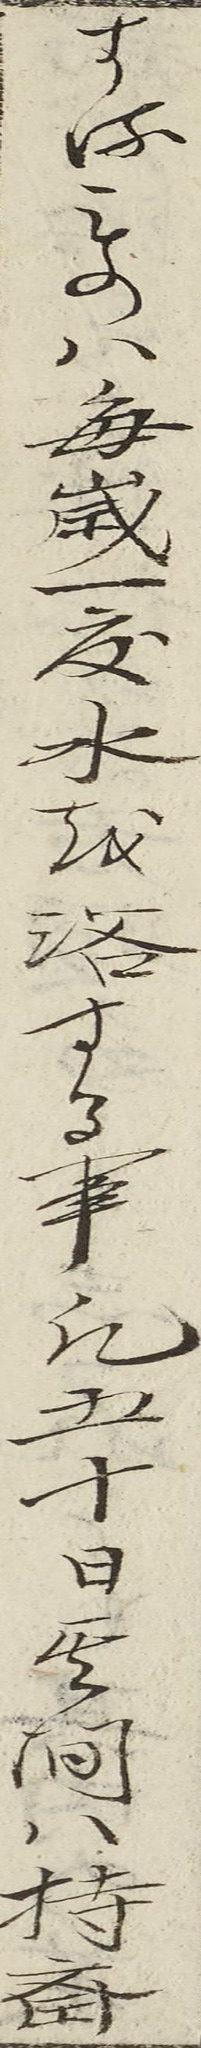するものハ毎歳一度水を浴する事凡五十日其間は持斎
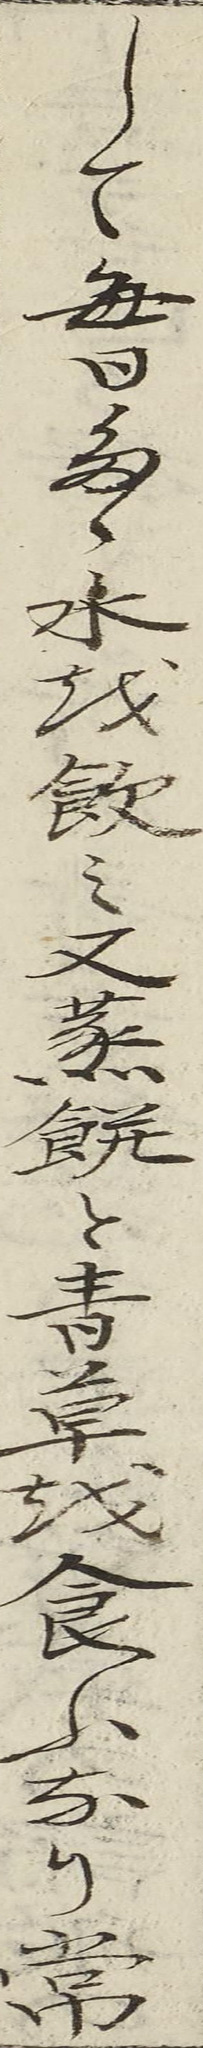して毎日たゝ水を飲ミ又蒸餅と青草食ふなり常
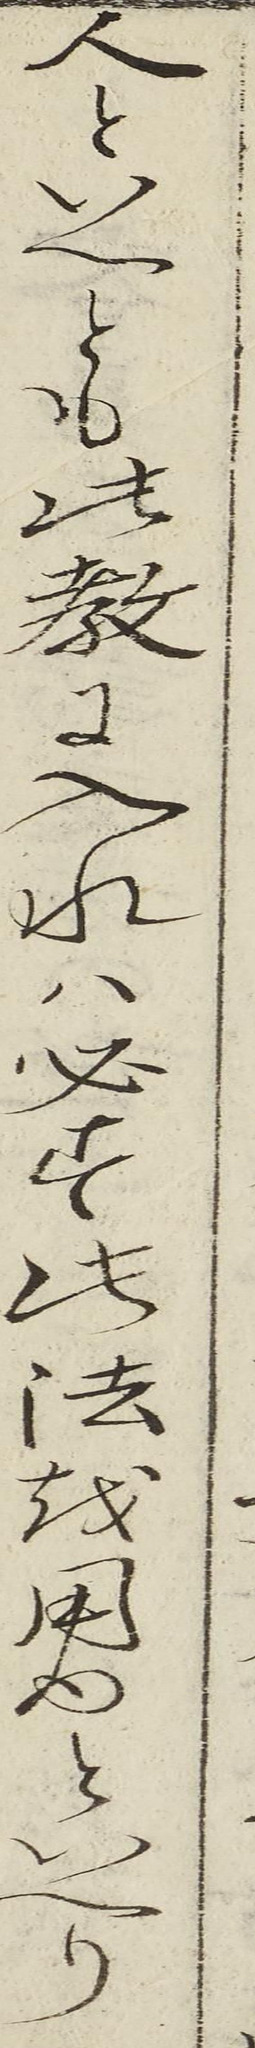人といへとも此教に入れハ必其法を用ゆといへり

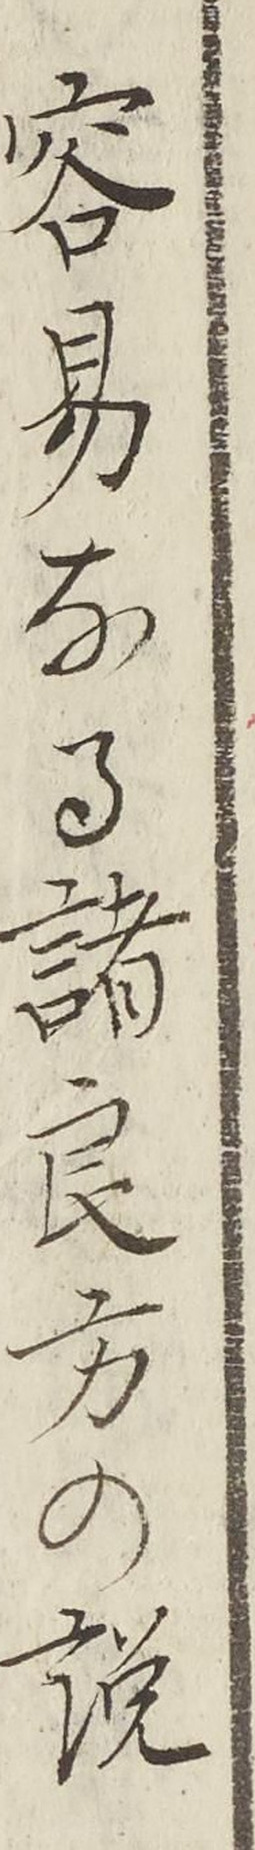容易なる諸良方の説
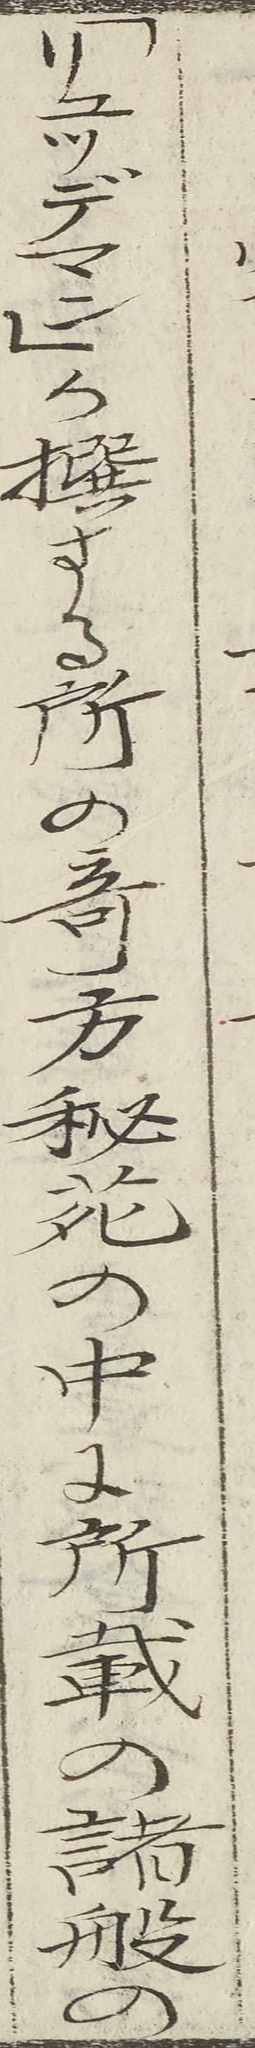「リュツデマン」か撰する所の奇方秘苑の中に所載の諸般の
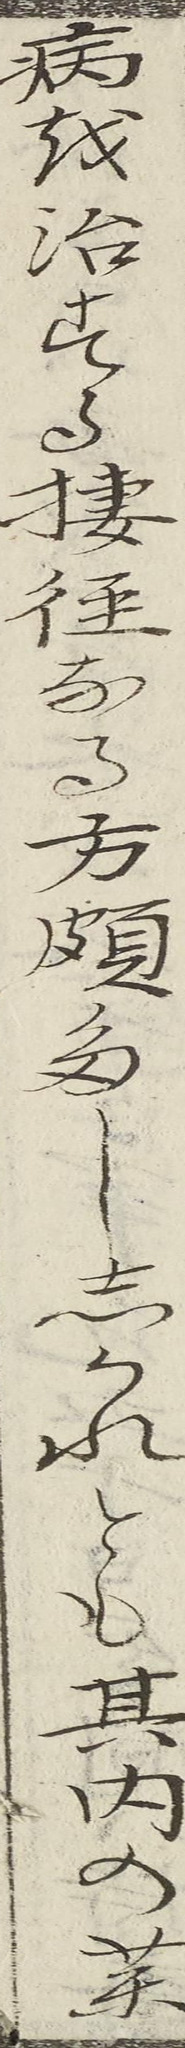病を治する捿往なる方頗多ししかれとも其内の薬
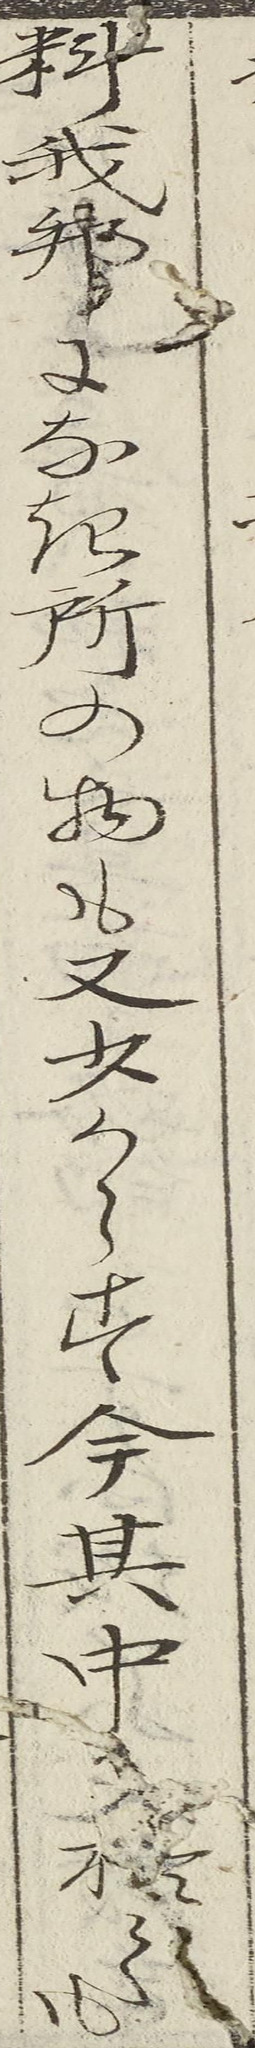料我邦になき所の物も又少からす今其中に於ても
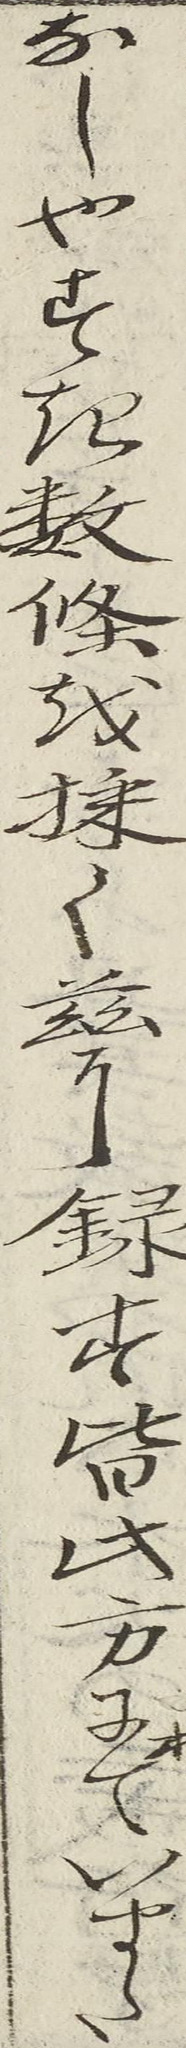なしやすき教條を採て茲に録す皆此方に於ていまた
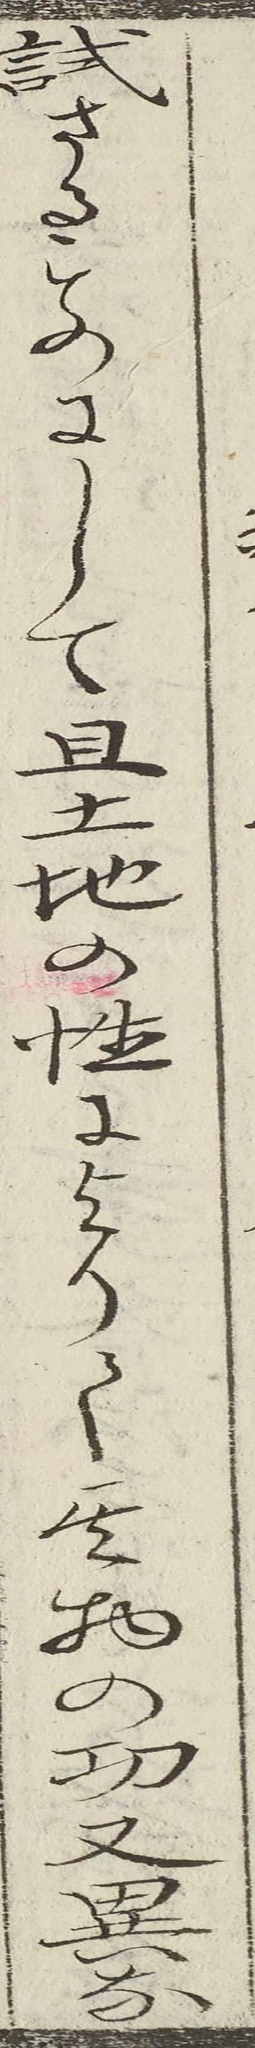試さるものにして且土地の性によりて其物の功又異な
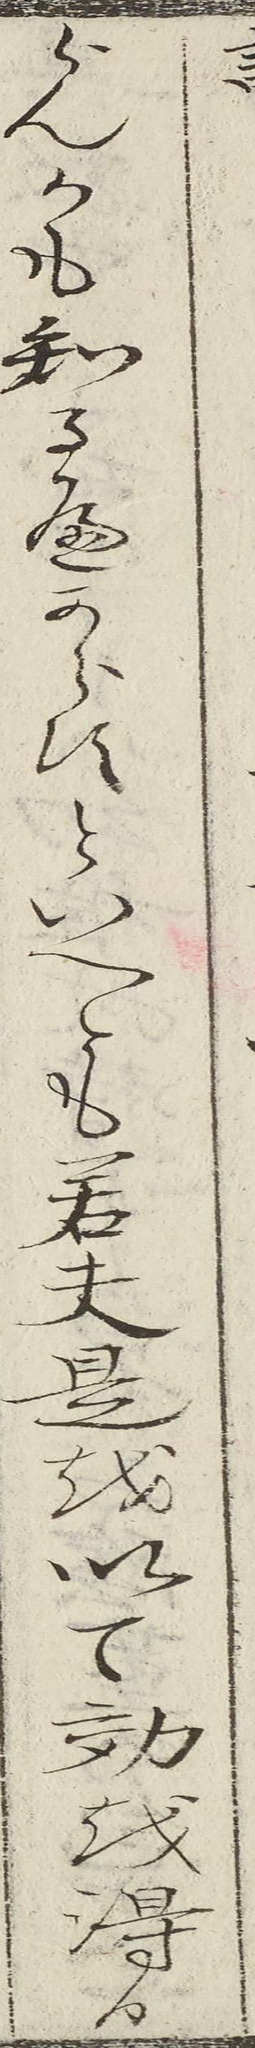らんかも知るへからすといへとも若夫是を以て効を得る
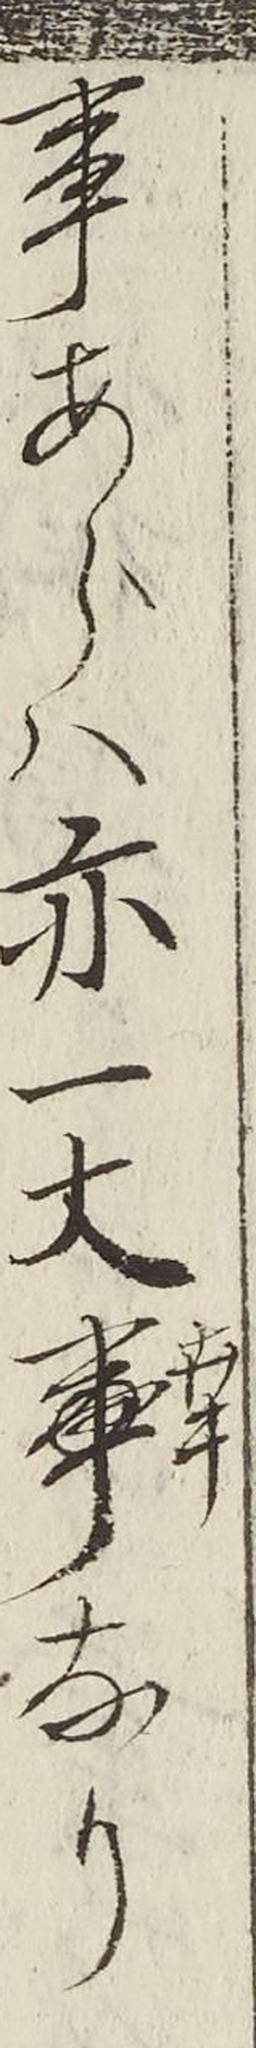事あらハ亦一大幸なり
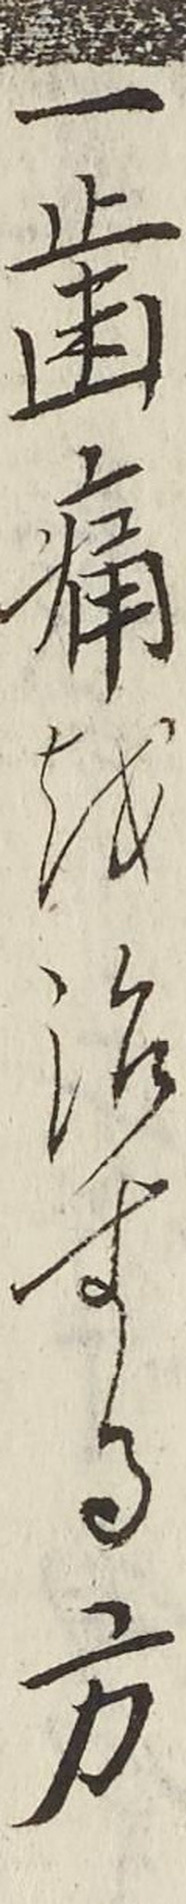一歯痛を治する方
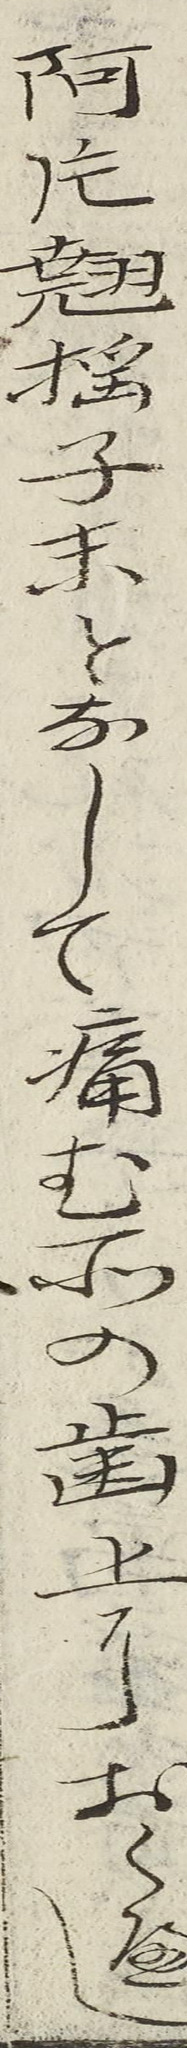阿片翹揺子末となして痛む所の歯上におくへし
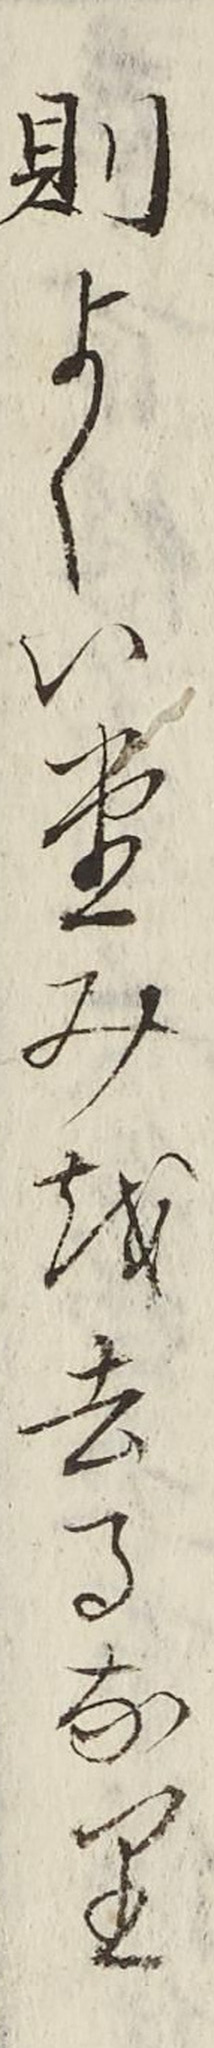則よくいたみを去るなり
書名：西洋雜記　坤
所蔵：東京大学地震研究所図書室 Earthquake Research Institute Library, The University of Tokyo, JAPAN
